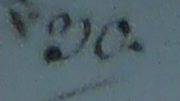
30.
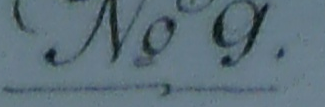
No͇ 9.
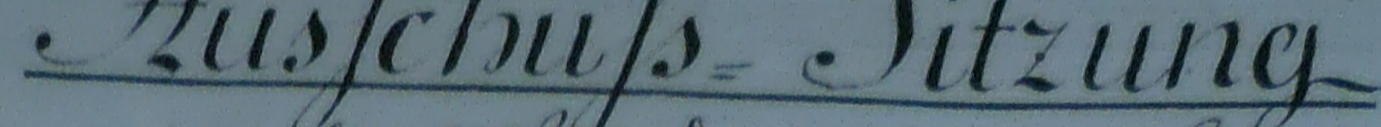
Ausschuss‗Sitzung
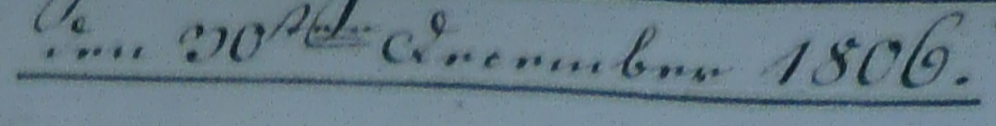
den 30ste͇n͇ Dezember 1806.
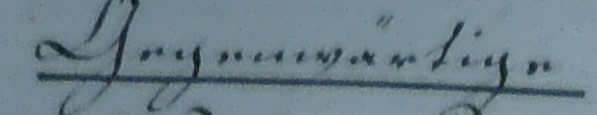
Gegenwärtige
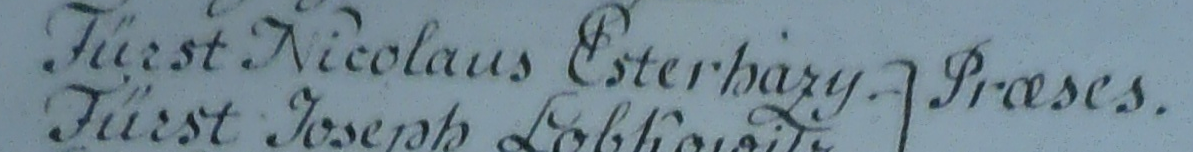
Fürst Nicolaus Esterhàzy. Præses.
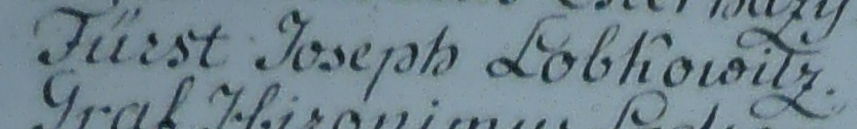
Fürst Joseph Lobkowitz.
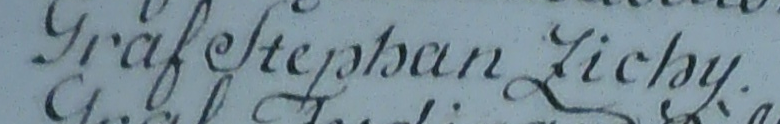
Graf Stephan Zichy.
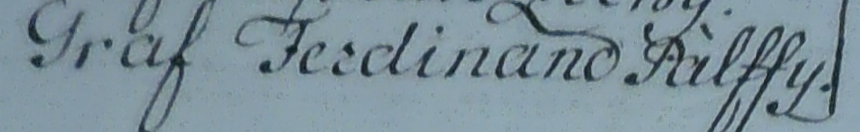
Graf Ferdinand Pàlffy.
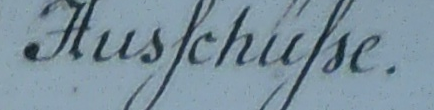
Ausschüsse.
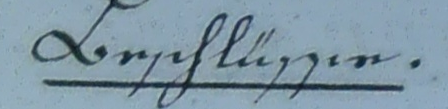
Beschlüsse.
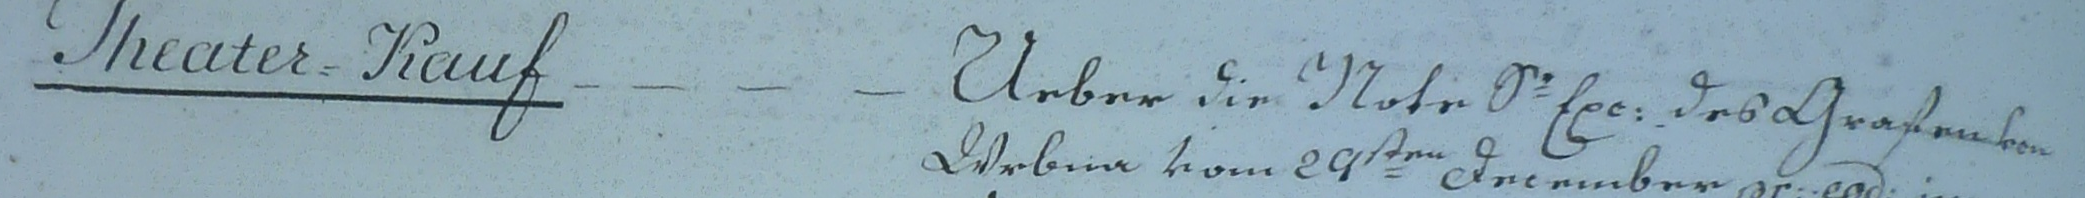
Theater‗Kauf _ _ _ _ Ueber die Note Se͇ Exc: des Grafen von
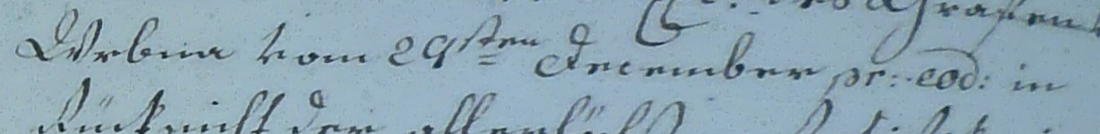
Wrbna vom 29st͇en December pr: eod: in
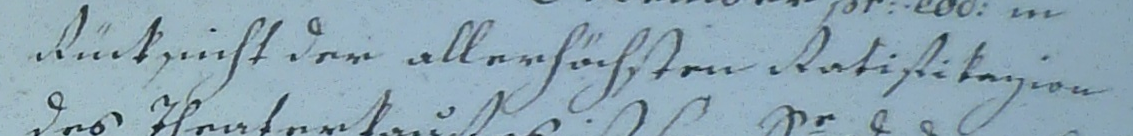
Rücksicht der allerhöchsten Ratifikazion
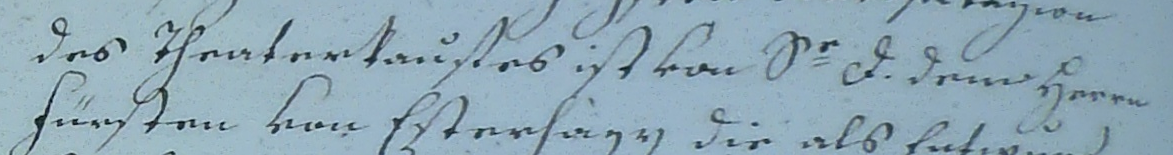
des Theaterkaufes ist von Se͇ D. dem Herrn
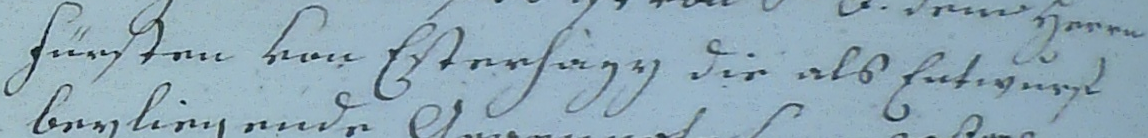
Fürsten von Esterhàzy die als Entwurf
